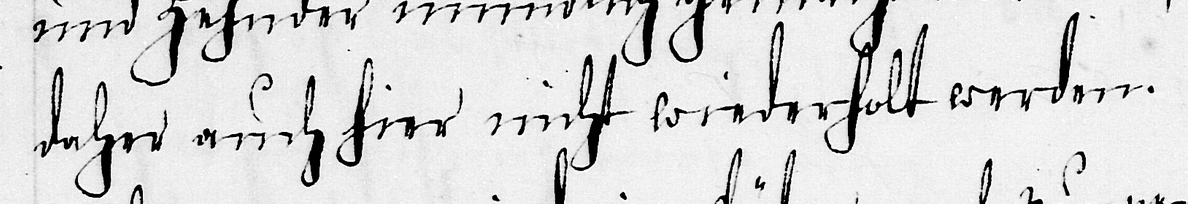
daher auch hier nicht wiederholt werden.
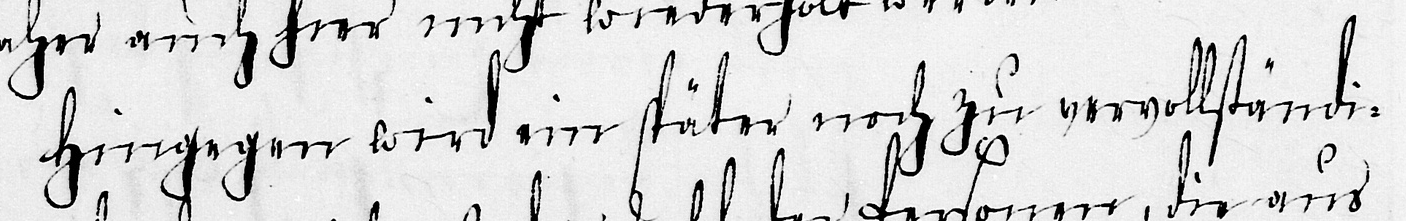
Hingegen wird ein später noch zu vervollständi¬
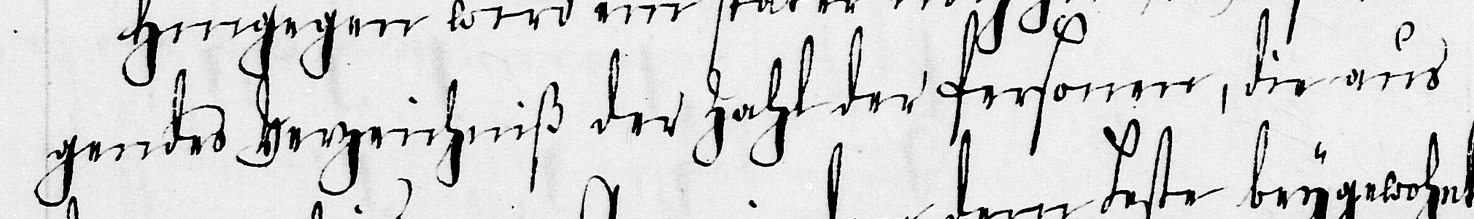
gendes Verzeichniß der Zahl der Personen, die aus
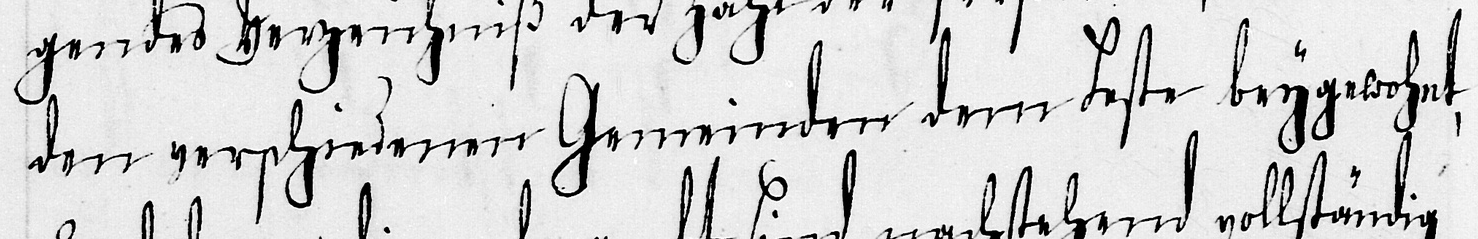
den verschiedenen Gemeinden dem Feste beygewohnt,
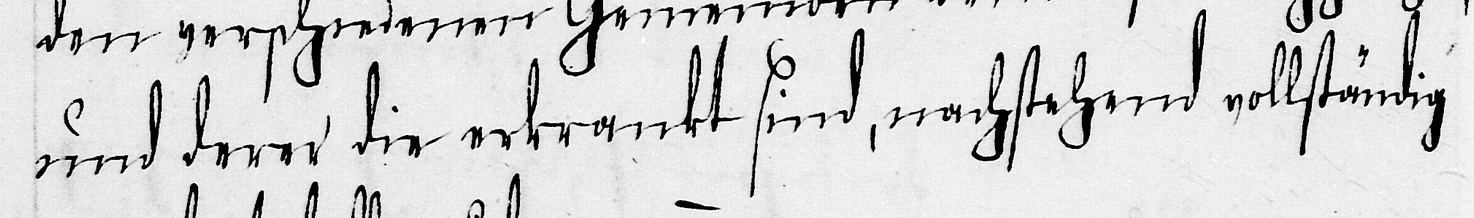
und derer die erkrankt sind, nachstehend vollständ¬
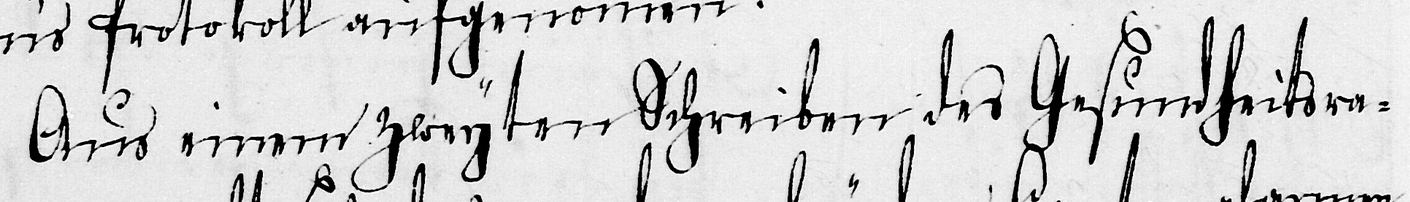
Aus einem zweyten Schreiben des Gesundheitsra¬
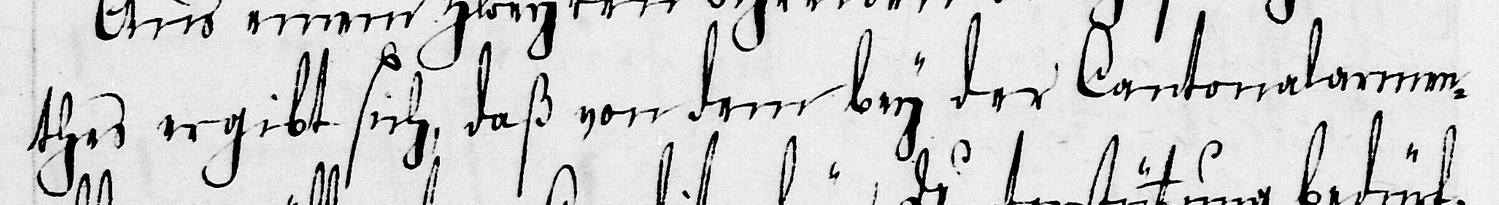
thes ergibt sich, daß von dem bey der Cantonalarmen¬
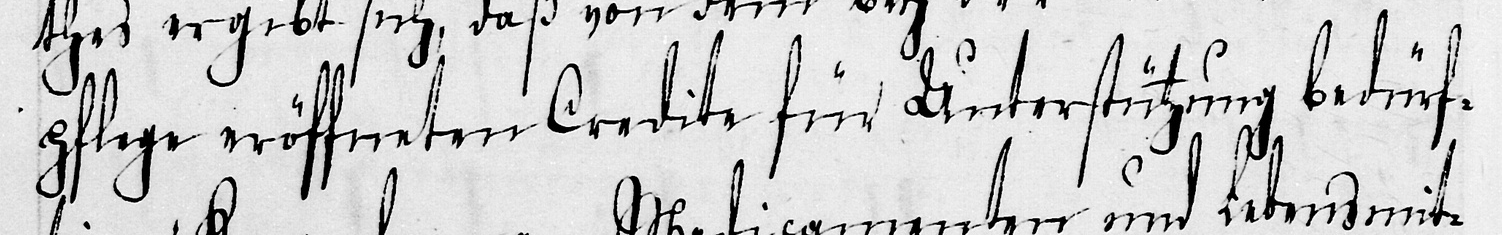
pflege eröffneten Credite für Unterstützung bedürf¬
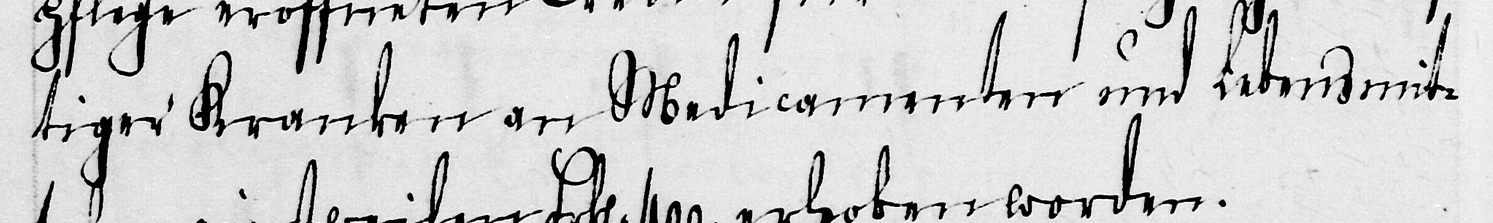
tiger Kranken an Medicamenten und Lebensmit¬
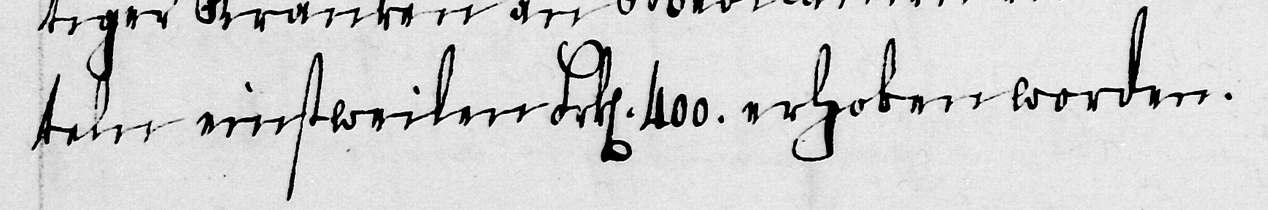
teln einstweilen Frk[en]. 400. erhoben worden.
